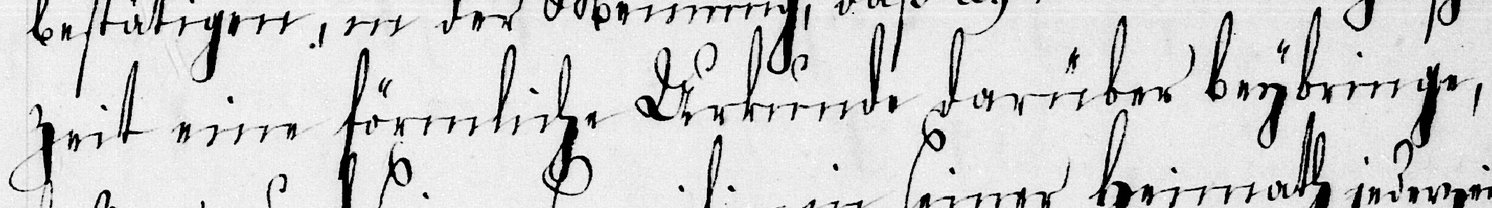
zeit eine förmliche Urkunde darüber beybringe,
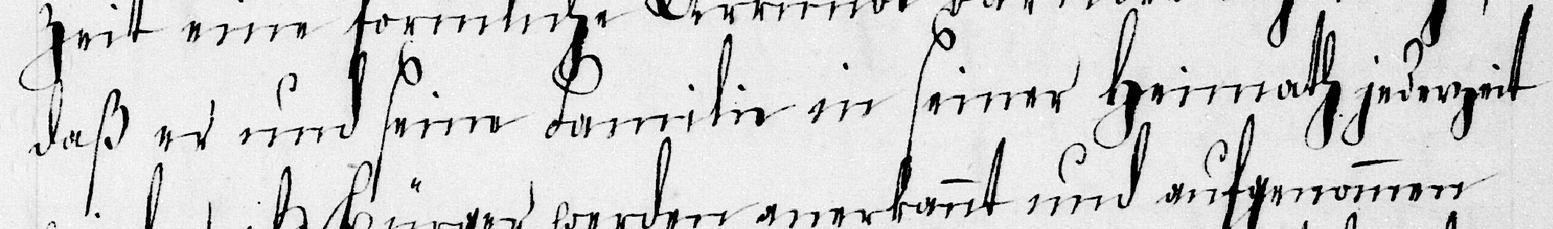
daß er und seine Familie in seiner Heimath jederzeit
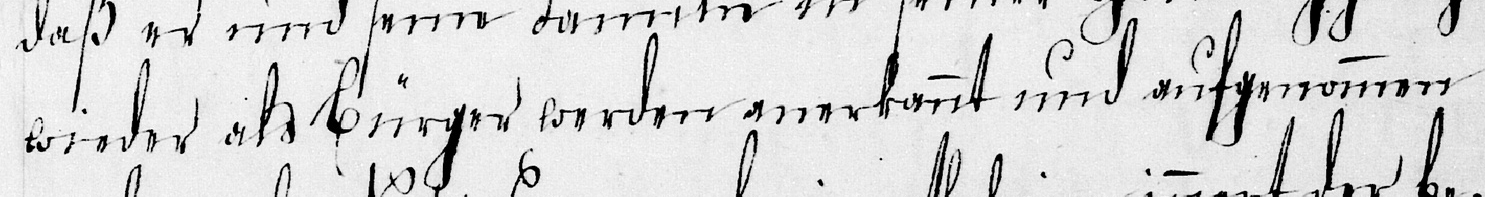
wieder als Bürger werden anerkannt und aufgenommen
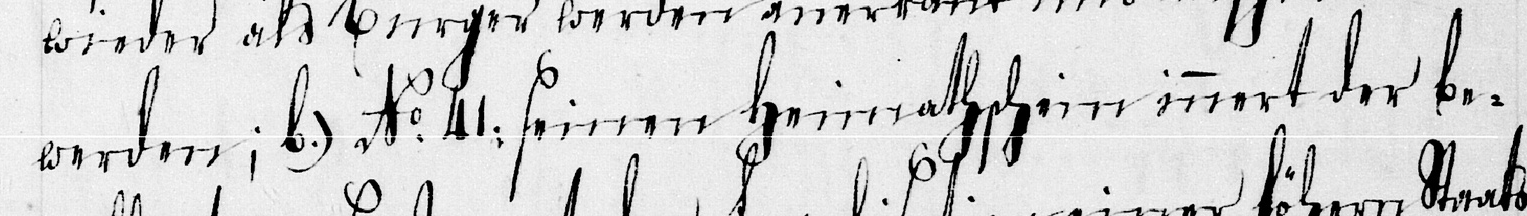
werden; b.) No. 41. seinen Heimathschein innert der be¬
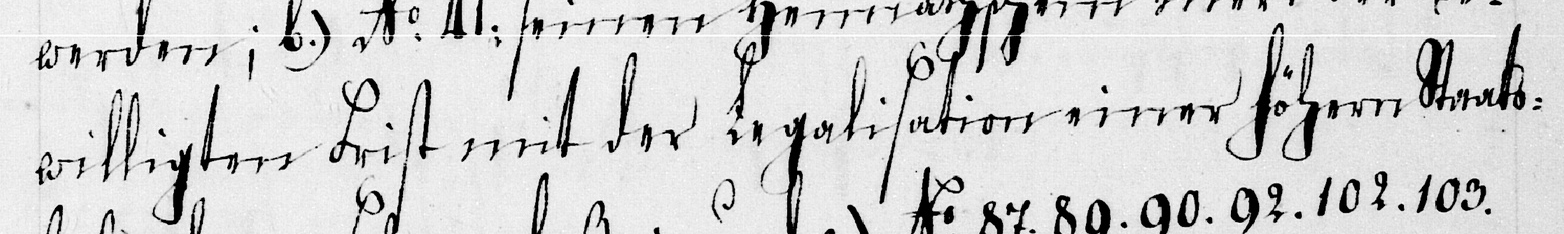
willigten Frist mit der Legalisation einer höhern Staats¬
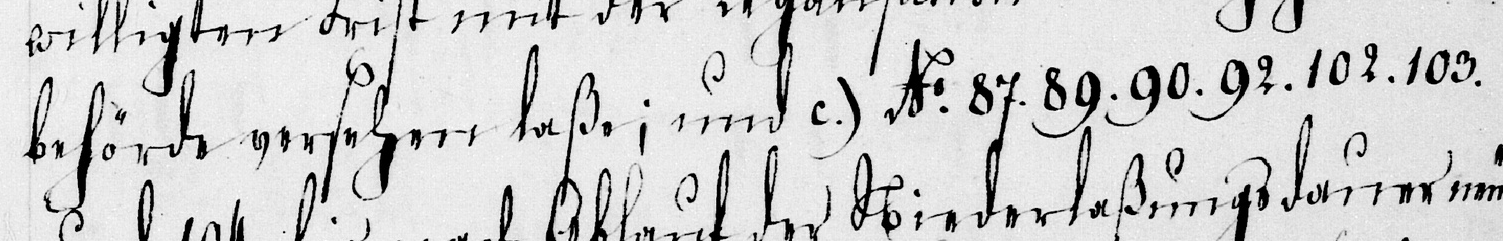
behörde versehen laße; und c.) No. 87. 89. 90. 92. 102. 103.
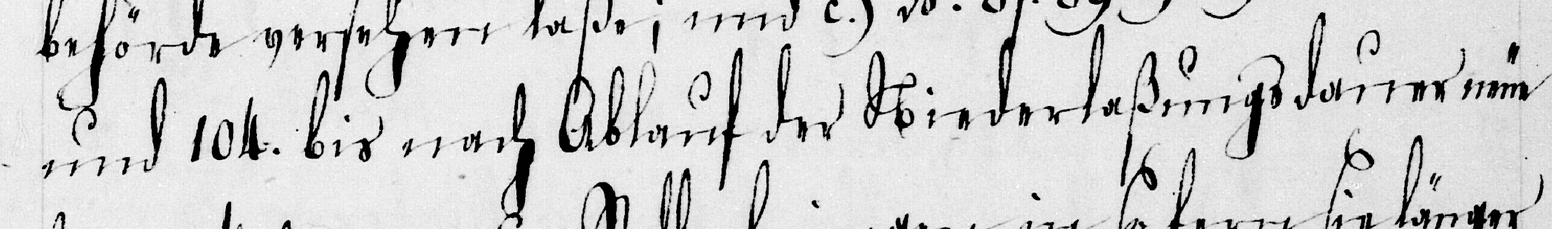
und 104. bis nach Ablauf der Niederlaßungsdauer neue
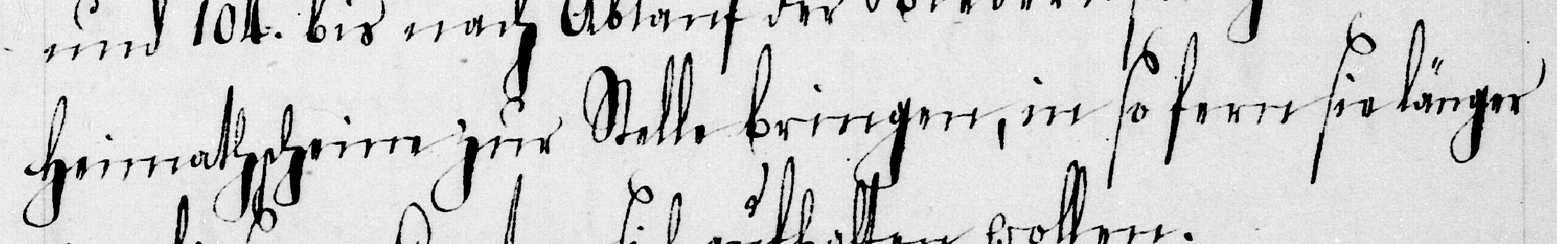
Heimathscheine zur Stelle bringen, in so fern sie länger
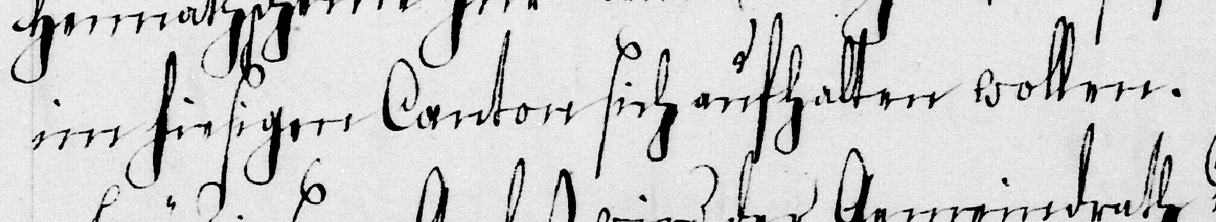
im hiesigen Canton sich aufhalten wollen.
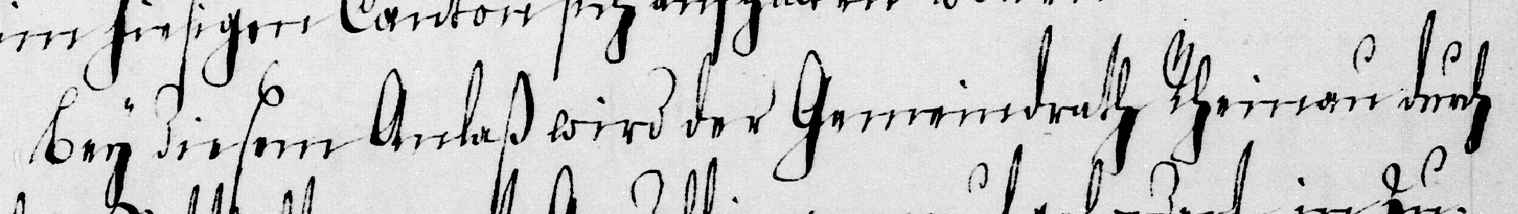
Bey diesem Anlaß wird der Gemeindrath Rheinau durch
